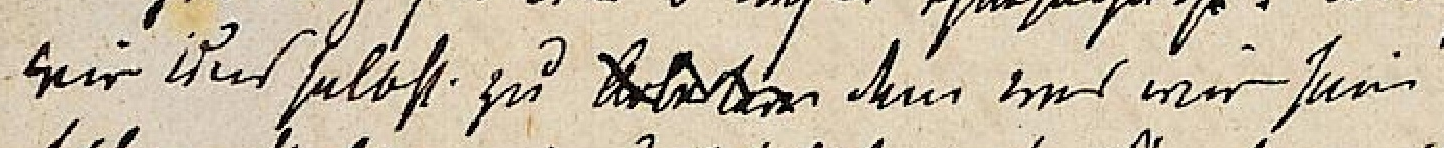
wir uns selbst zu Arbeitern dem was wir sein
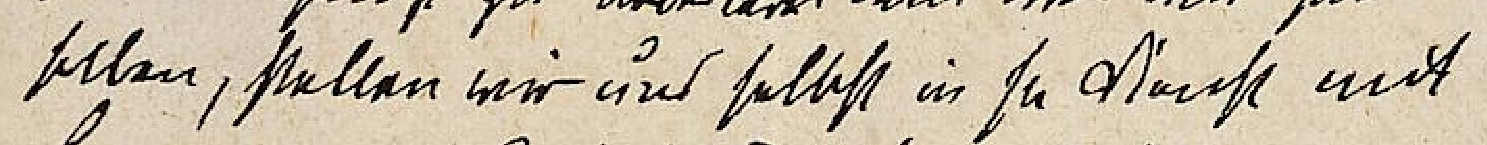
sollen, stellen wir uns selbst in sn Dienst mit
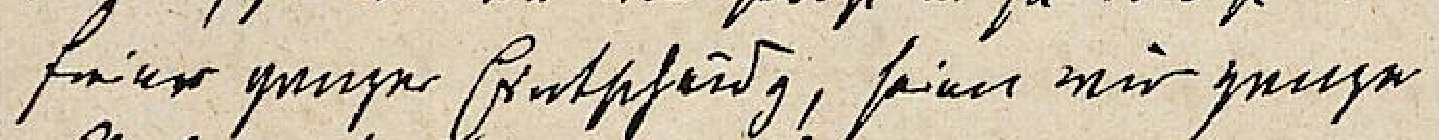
freier ganzer Entscheidg, seien wir ganze
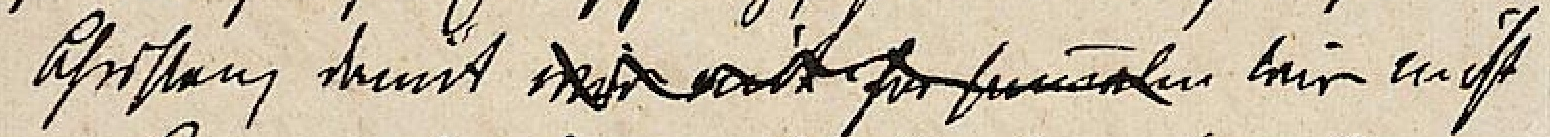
Christen, damit wir mit ihm sameln wir nicht
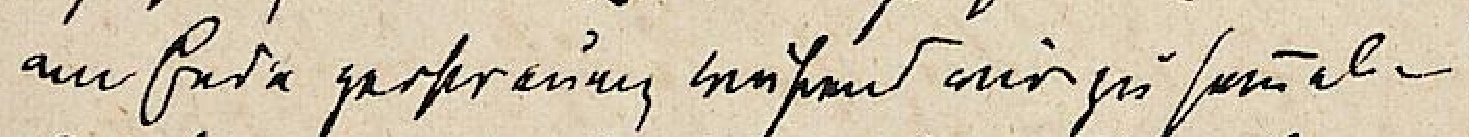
am Ende zerstreuen, während wir zu sameln
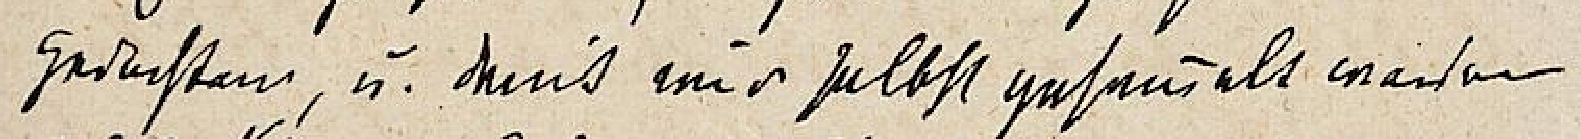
gedachten, u. damit wir selbst gesamelt werden
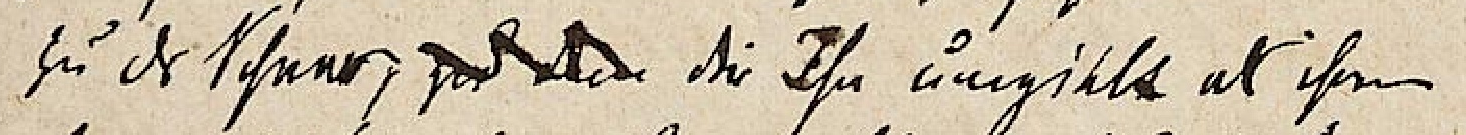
zu dr Schaar, zu dem die In umgiebt als ihrem
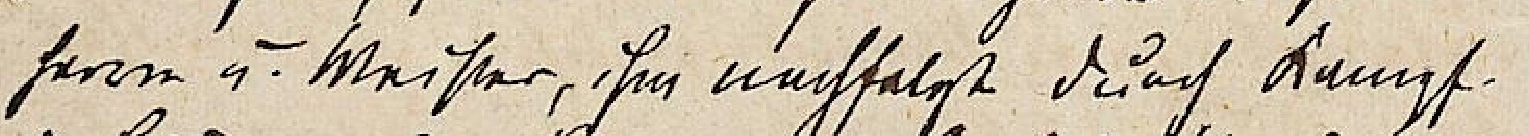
Herrn u. Meister, ihm nachfolgt durch Kampf
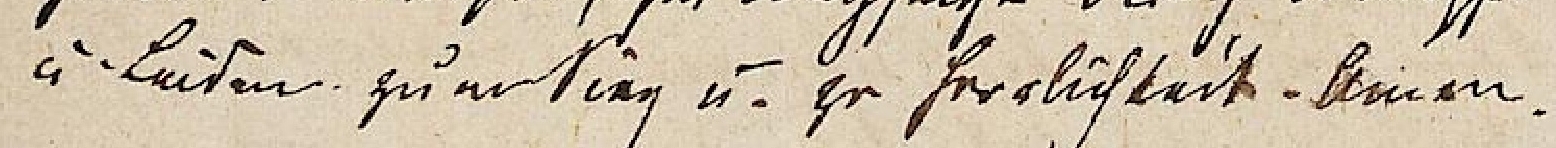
u. Leiden zum Sieg u. zr. Herrlichkeit. Amen.
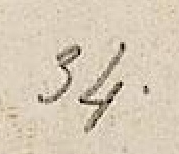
34.
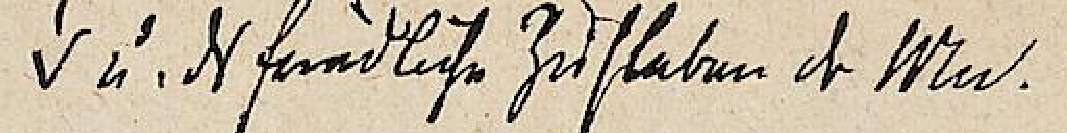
V u. ds friedliche Zusleben dr Mn.
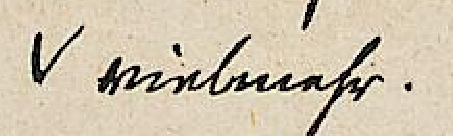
V vielmehr
